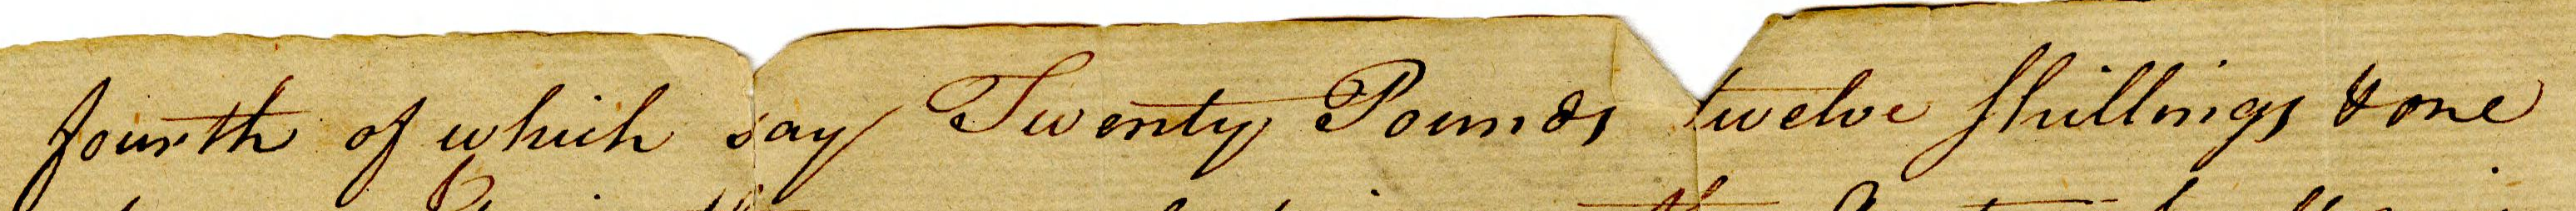fourth of which say Twenty Pounds twelve shillings & one
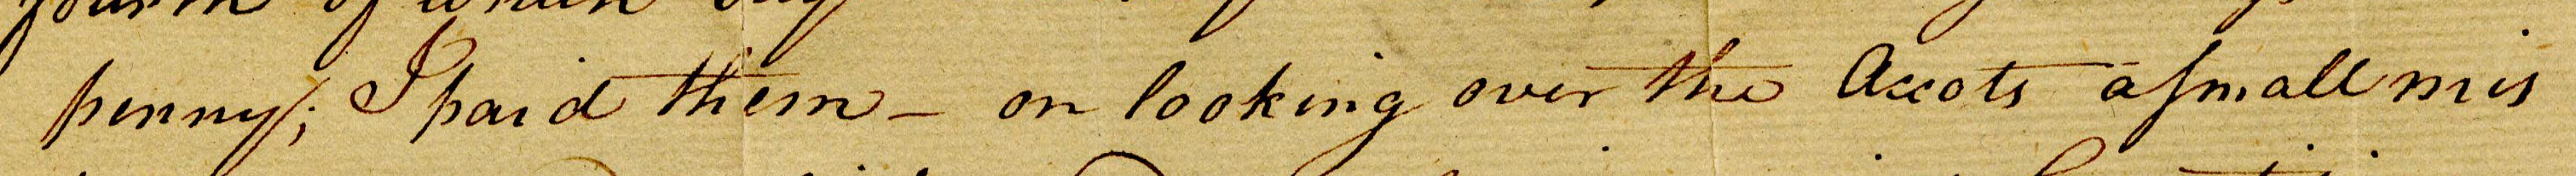penny; I paid them- on looking over the Accots a small mis
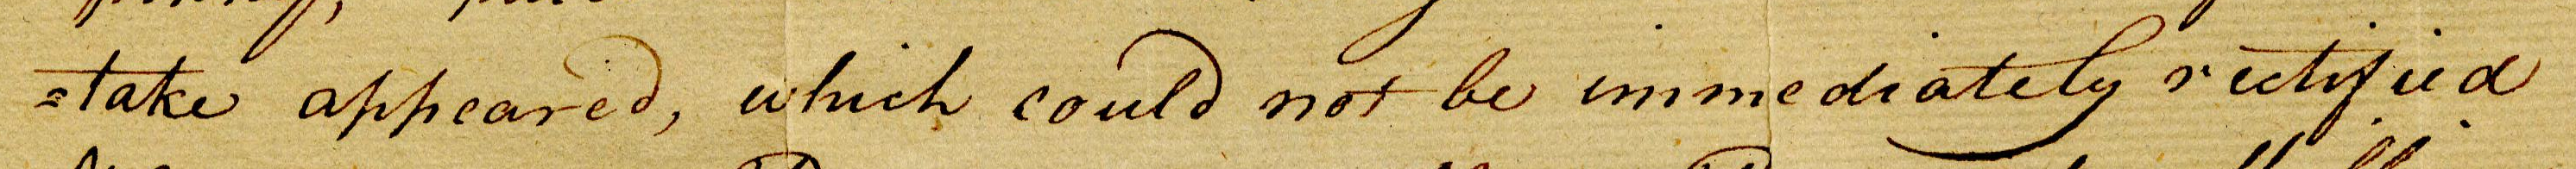-take appeared, which could not be immediately rectified
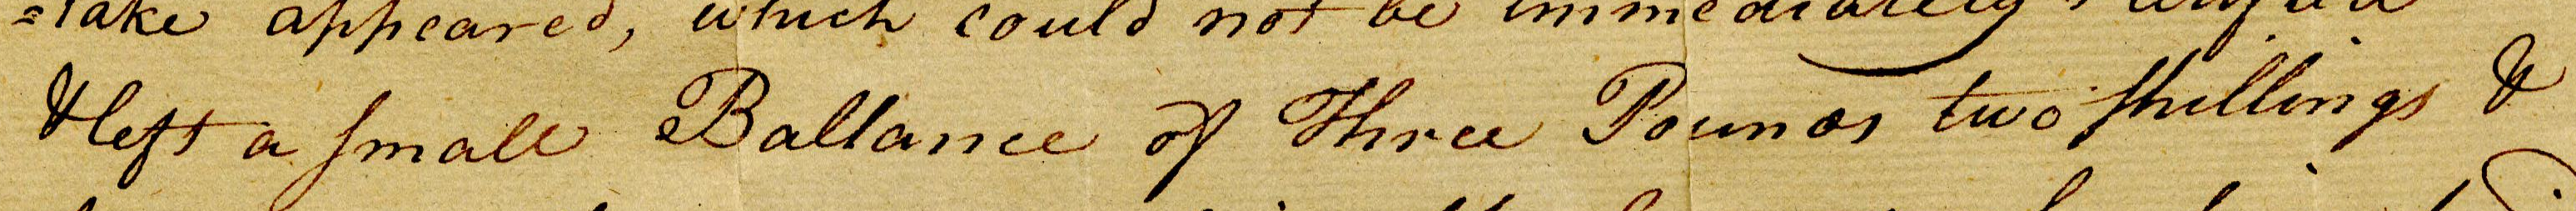& left a small Ballance of Three Pounds two shillings &
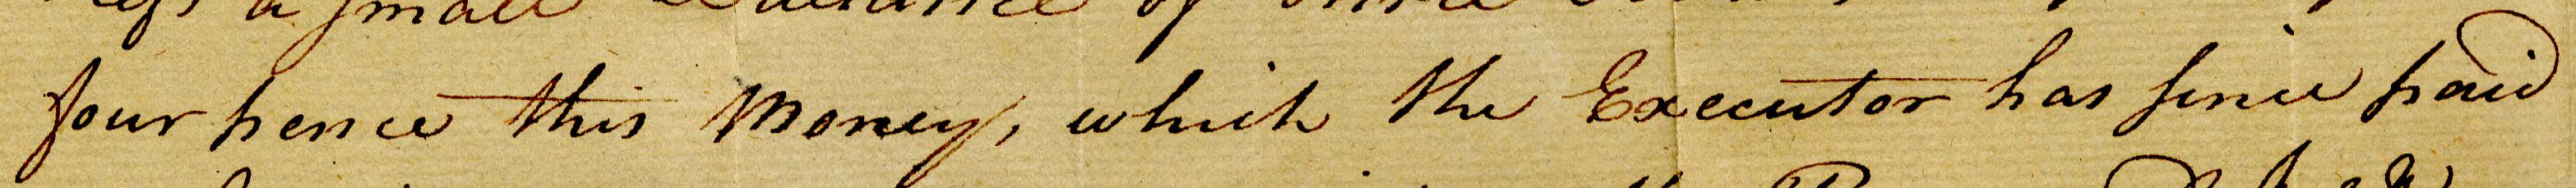four pence this money, which the Executor has since paid
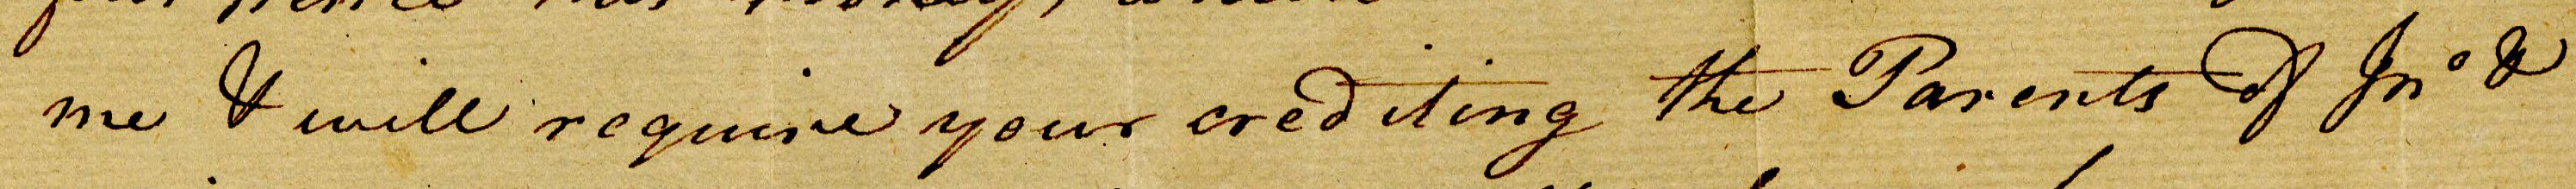me & will require your crediting the Parents of Jn^o &
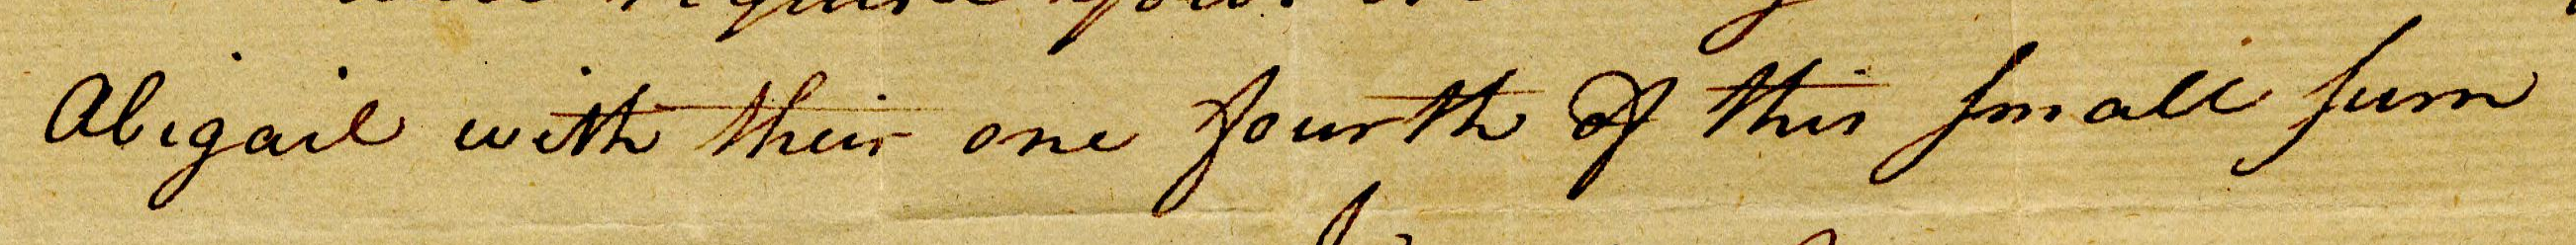Abigail with their one fourth of this small sum
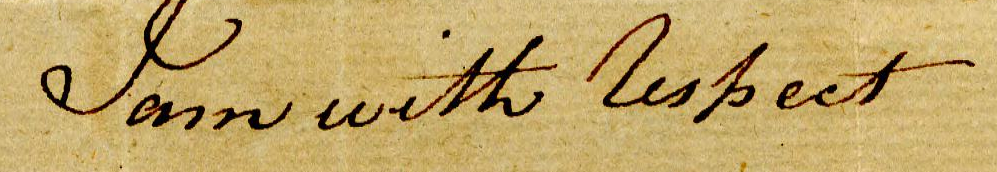I am with respect
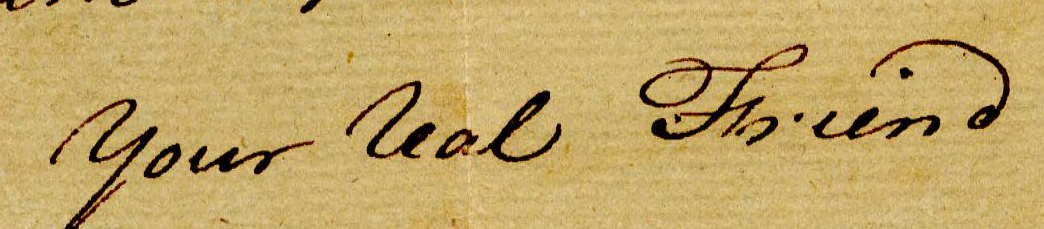your real Friend
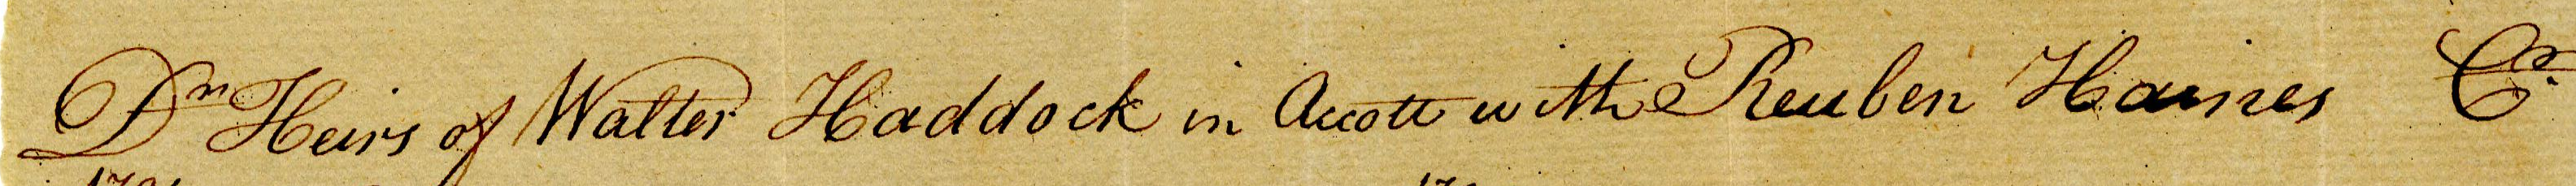D^r Heirs of Walter Haddock in Accott with Reuben Haines C^r.
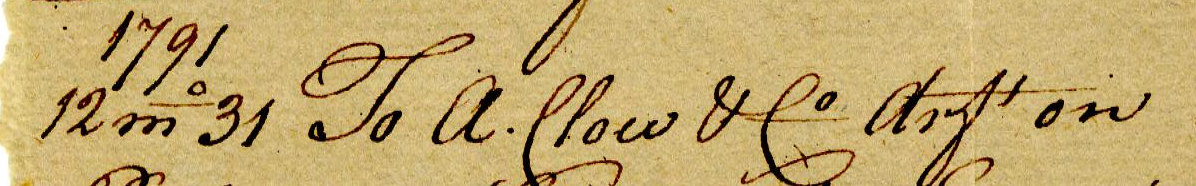^1791 12 m^o 31 To A. Clow & C^o drgh^t on
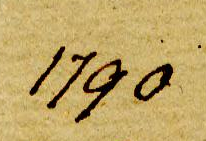1790
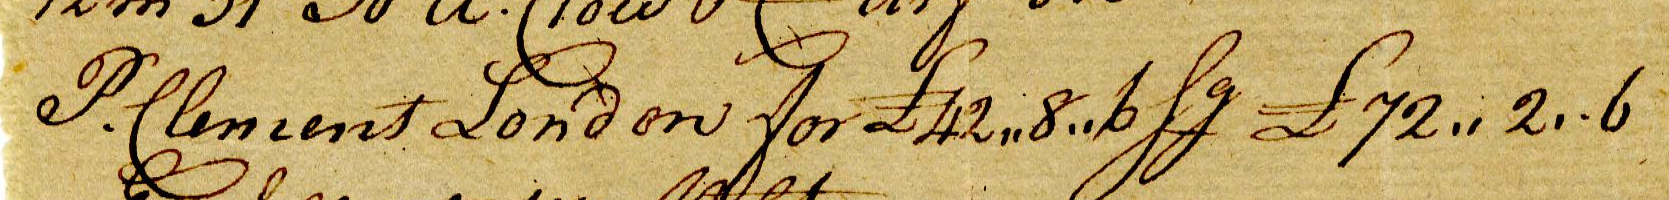P. Clement London for £42..8..bsg £72..2..6
